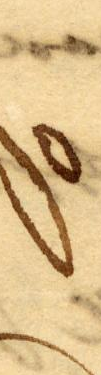To
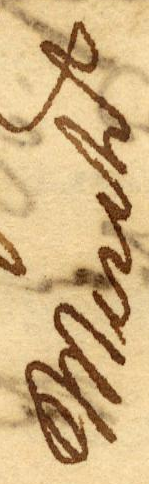Merch^t
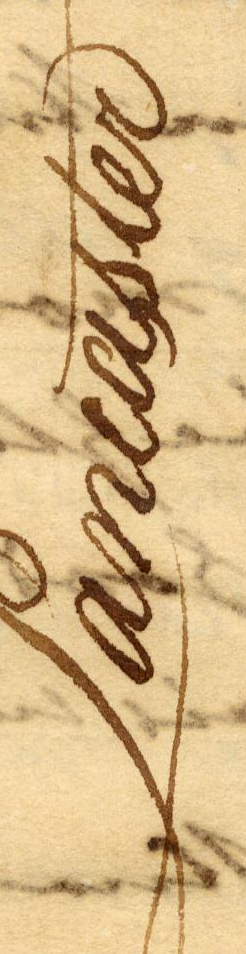Lancaster
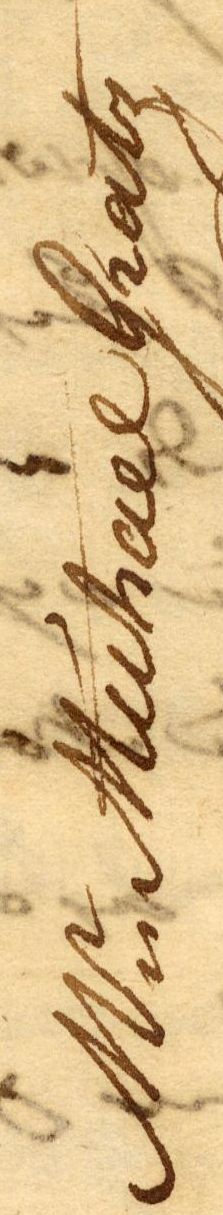M^r Michael Gratz
